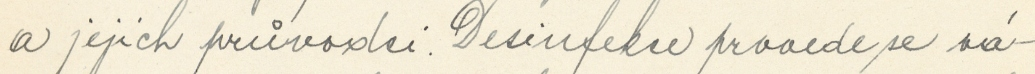a jejich průvodci. Desinfekce provede se vá-
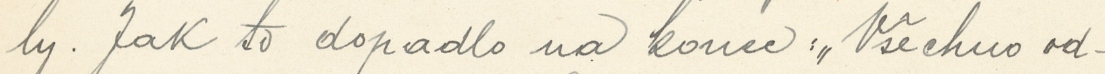ly. Jak to dopadlo na konec: „Všechno od-
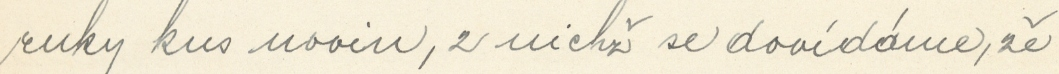ruky kus novin, z nichž se dovídáme, že
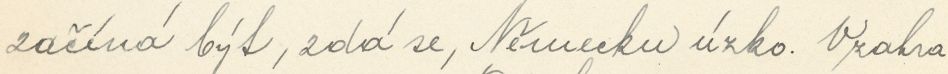začíná být, zdá se, Německu úzko. V zahra-
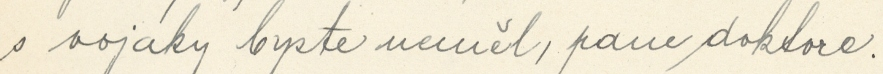s vojáky byste neměl, pane doktore.
